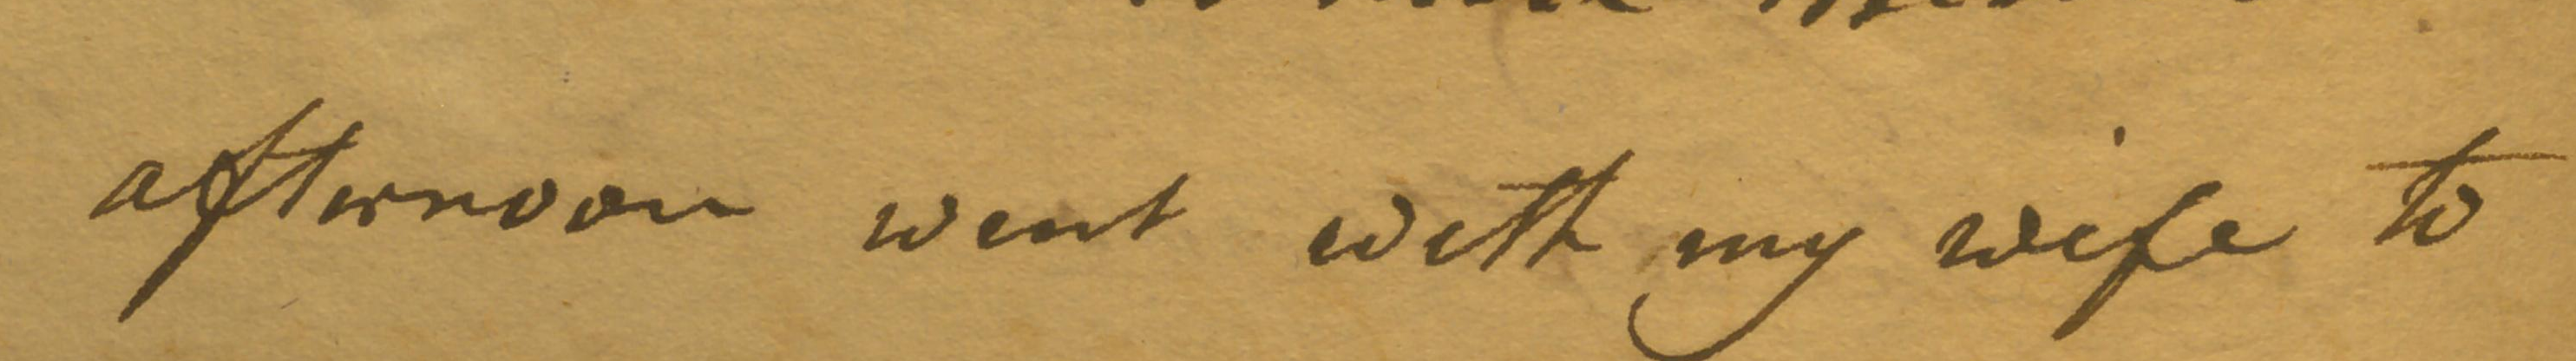afternoon went with my wife to
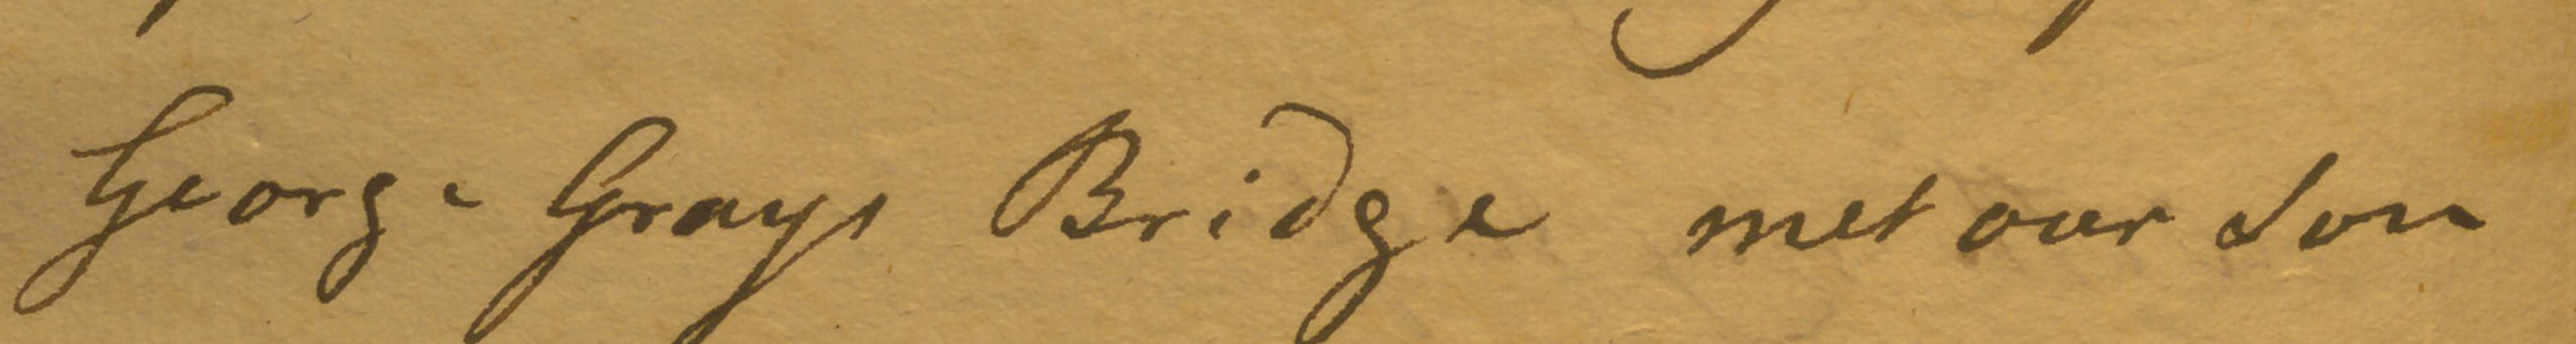George Grays Bridge met our son
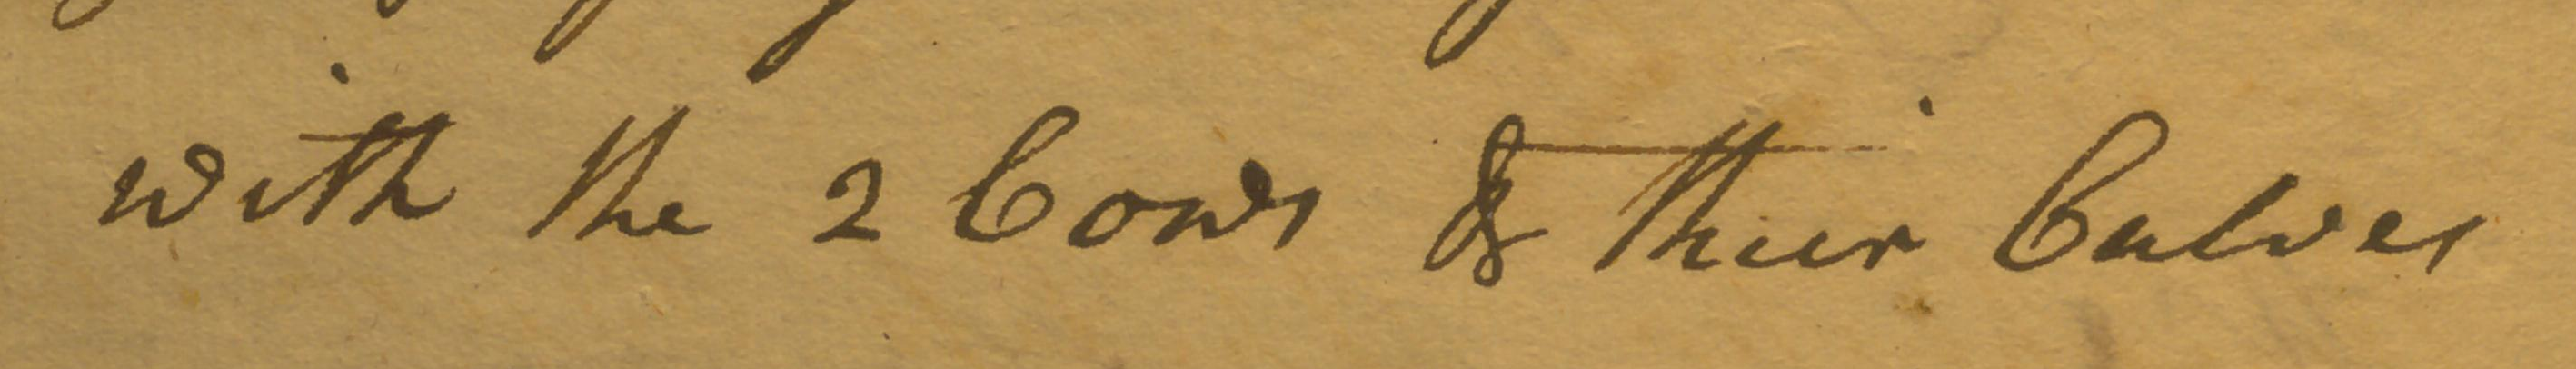with the 2 Cows & their Calves
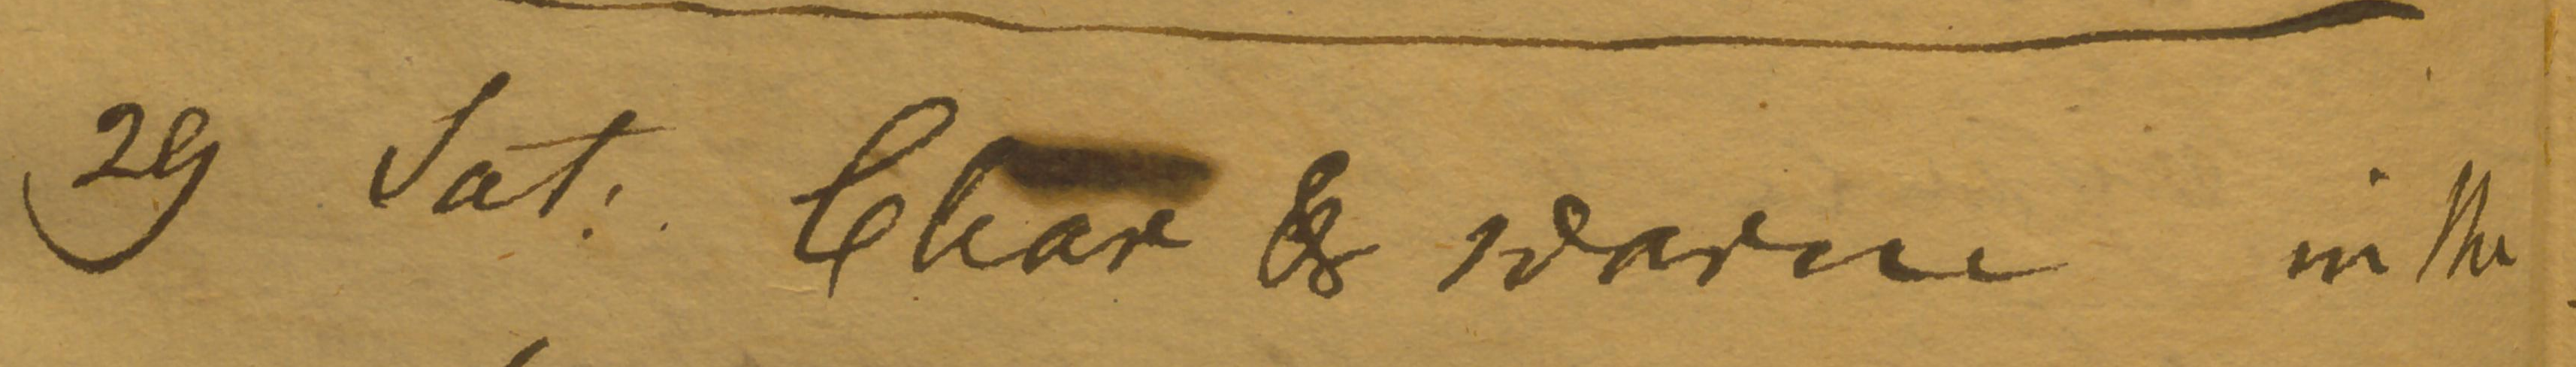29 Sat. Clear & warne, in the
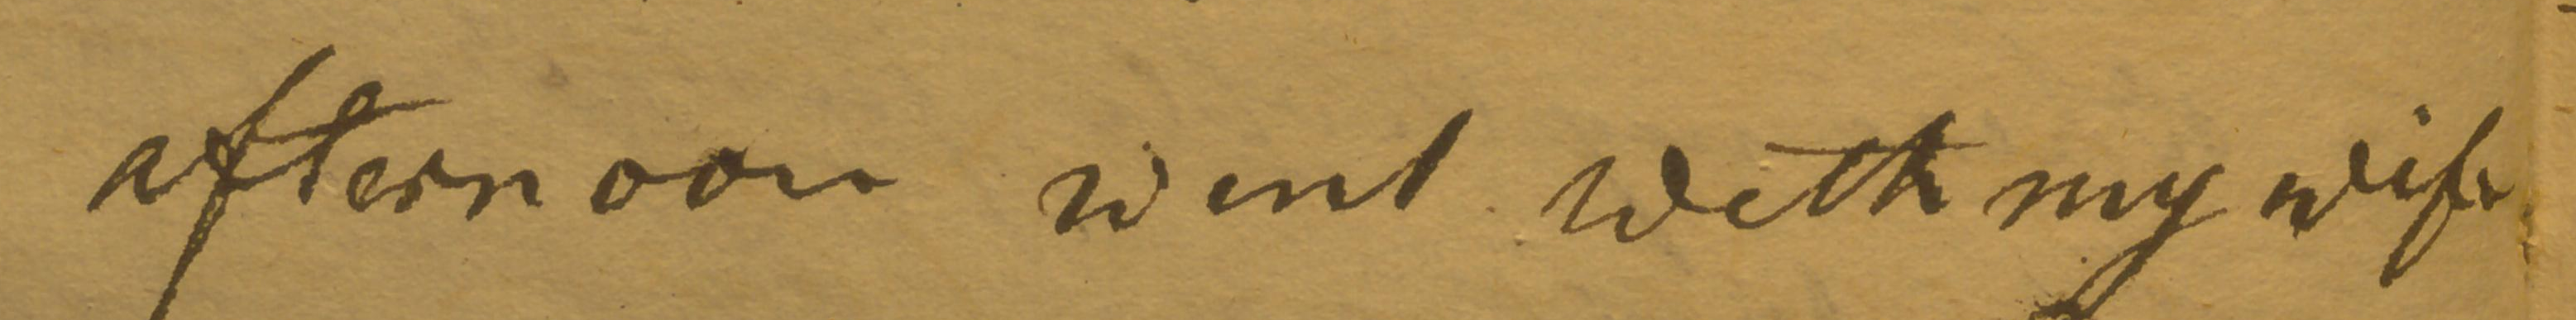afternoon went with my wife
